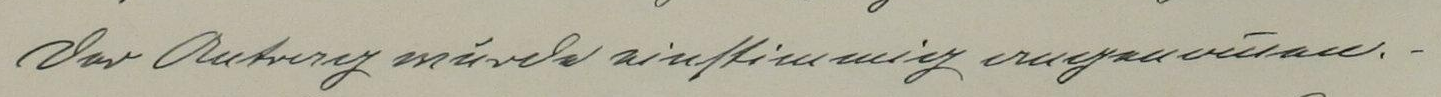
Der Antrag wurde einstimmig angenommen.
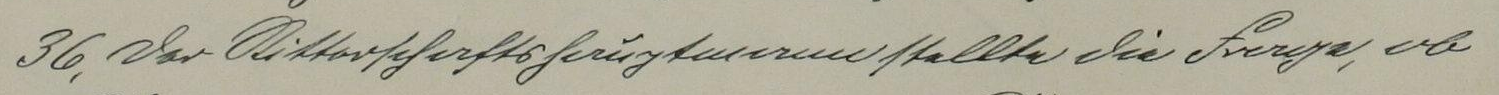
36. Der Ritterschaftshauptmann stellte die Frage, ob
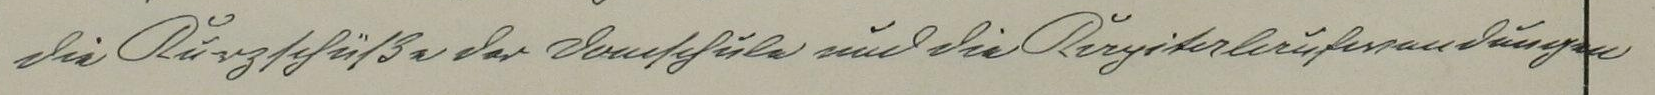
die Kurzschüße der Domschule und die Kapitalaufwendungen
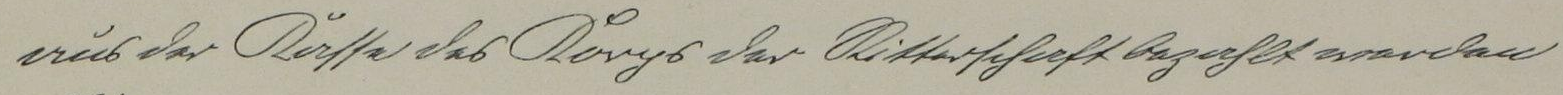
aus der Kasse des Korps der Ritterschaft bezahlt werden
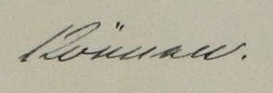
können.
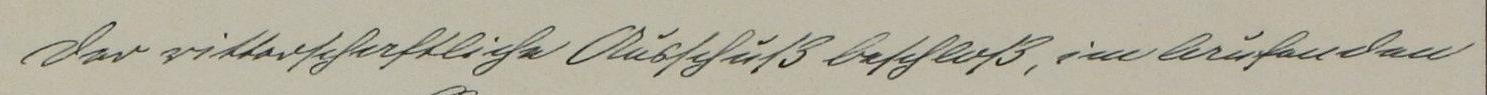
Der ritterschaftliche Ausschuß beschloß, im laufenden
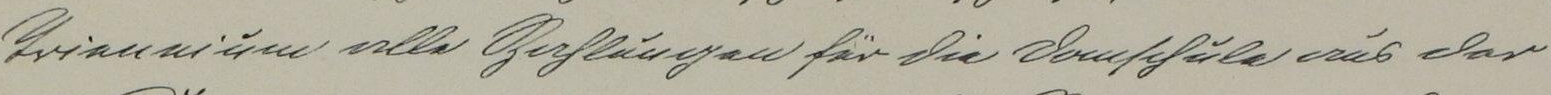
Triennium alle Zahlungen für die Domschule aus der
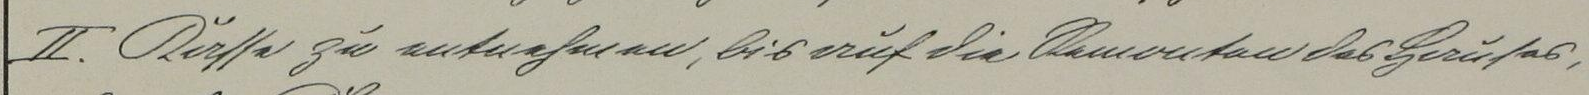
II. Kasse zu entnehmen, bis auf die Remonten des Hauses,
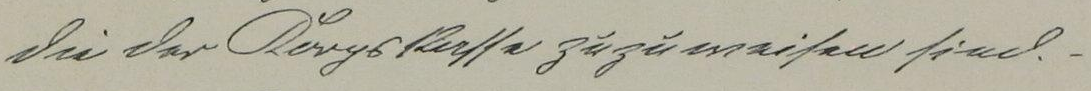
die der Korpskasse zuzuweisen sind.
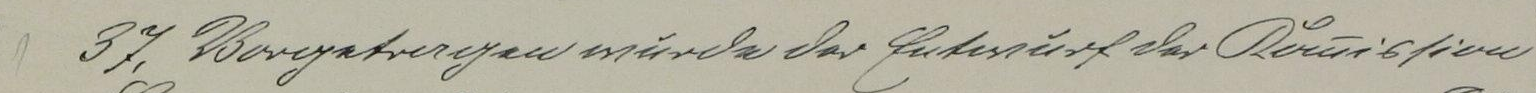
37. Vorgetragen wurde der Entwurf der Kommission
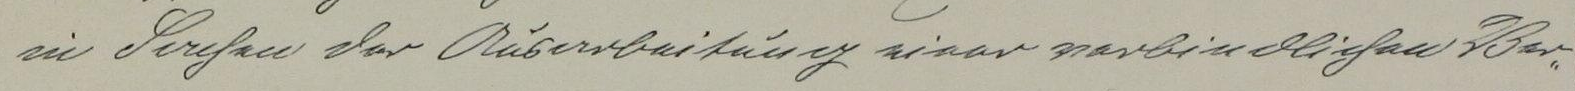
in Sachen der Ausarbeitung einer verbindlichen Ver-
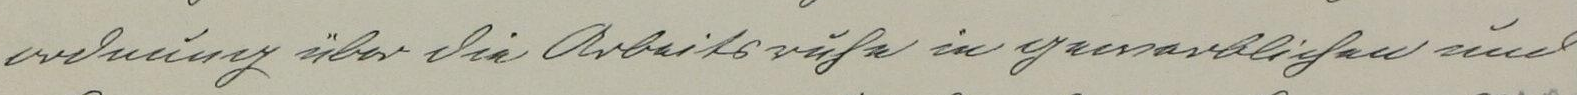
ordnung über die Arbeitsruhe in gewerblichen und
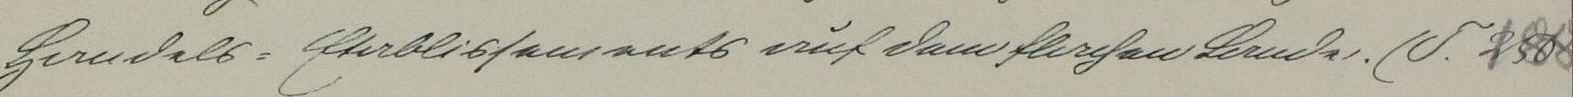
Handels-Etablissements auf dem flachen Lande (T.250
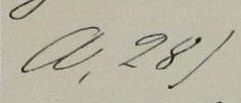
A.28).
